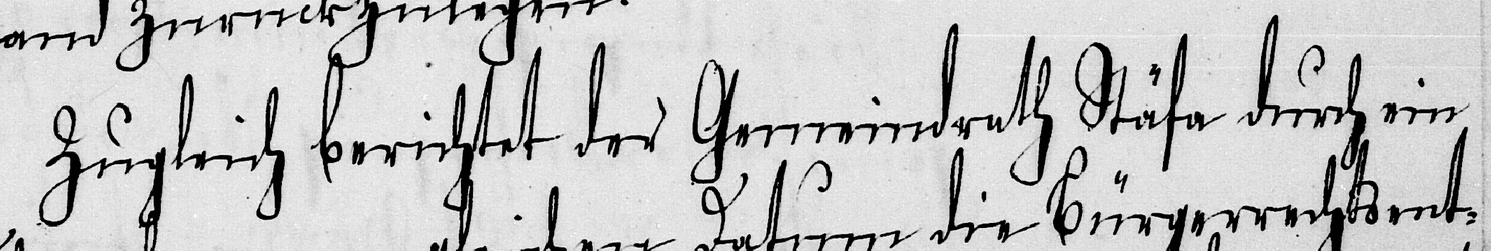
Zugleich berichtet der Gemeindrath Stäfa durch ein
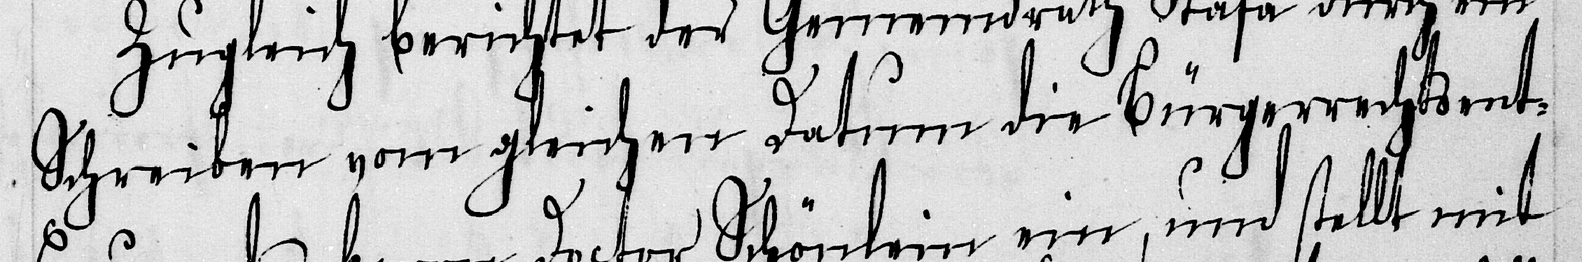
Schreiben vom gleichen Datum die Bürgerrechtsent¬
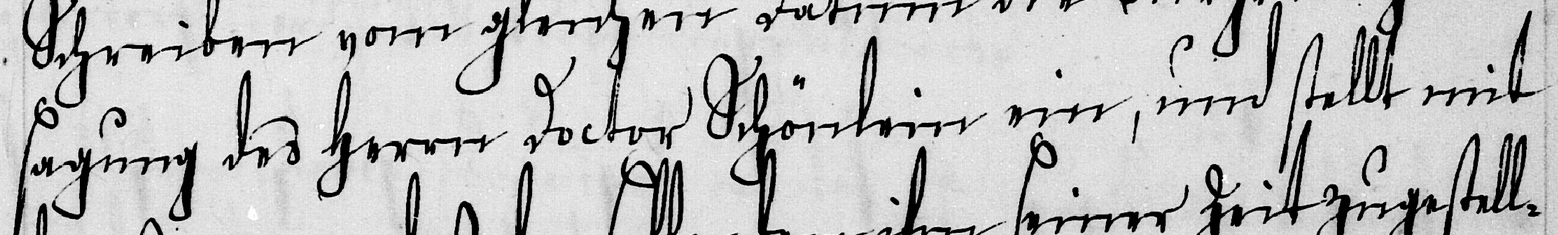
sagung des Herrn Doctor Schönlein ein, und stellt mit
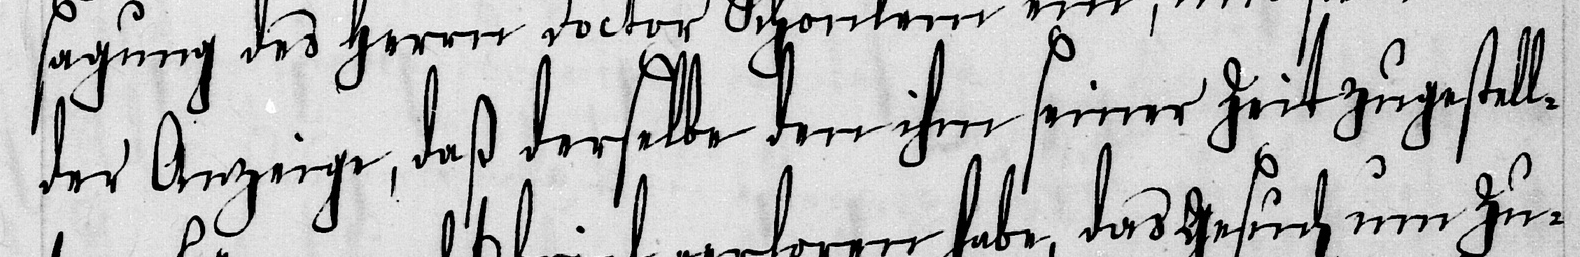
der Anzeige, daß derselbe den ihm seiner Zeit zugestel¬
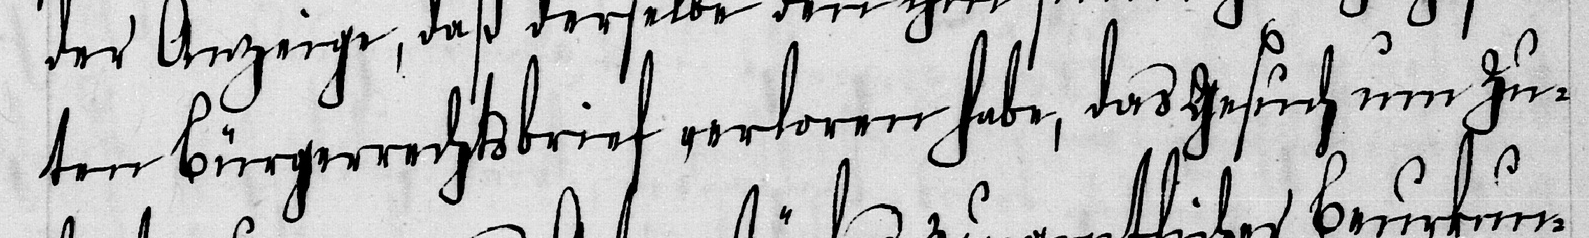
lten Bürgerrechtsbrief verloren habe, das Gesuch um Zu¬
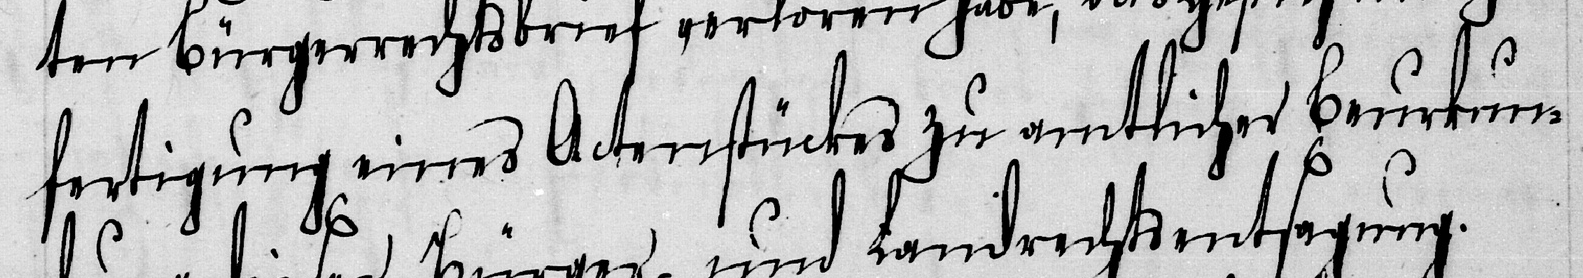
fertigung eines Actenstückes zu amtlicher Beurkun¬
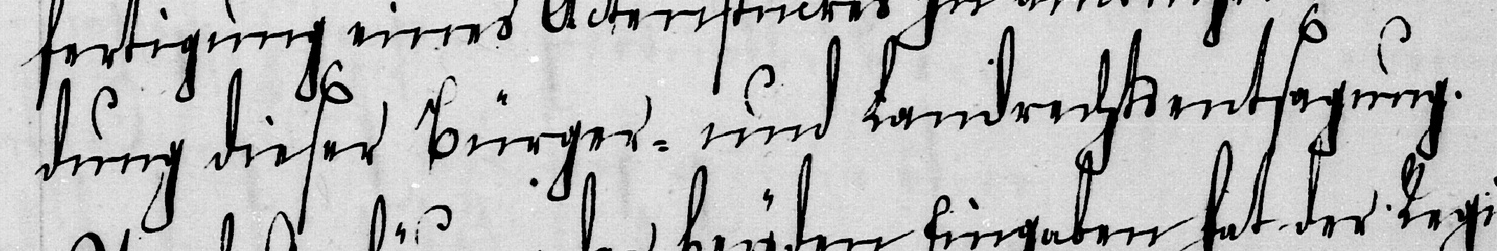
dung dieser Bürger- und Landrechtsentsagung.
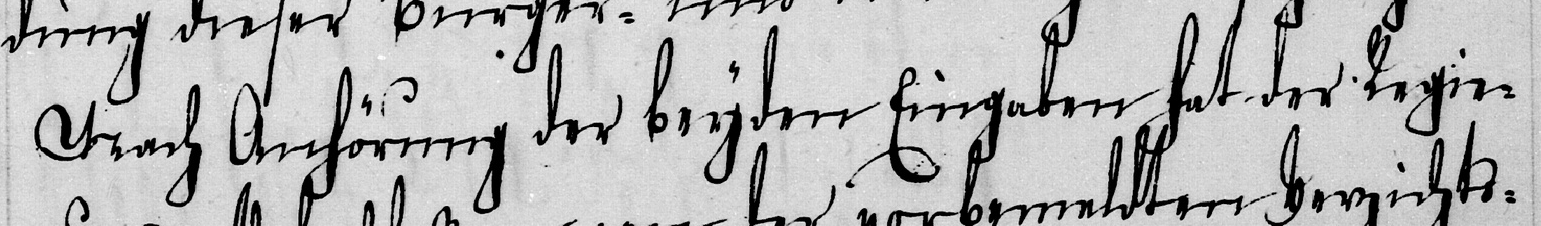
Nach Anhörung der beyden Eingaben hat der Regie¬
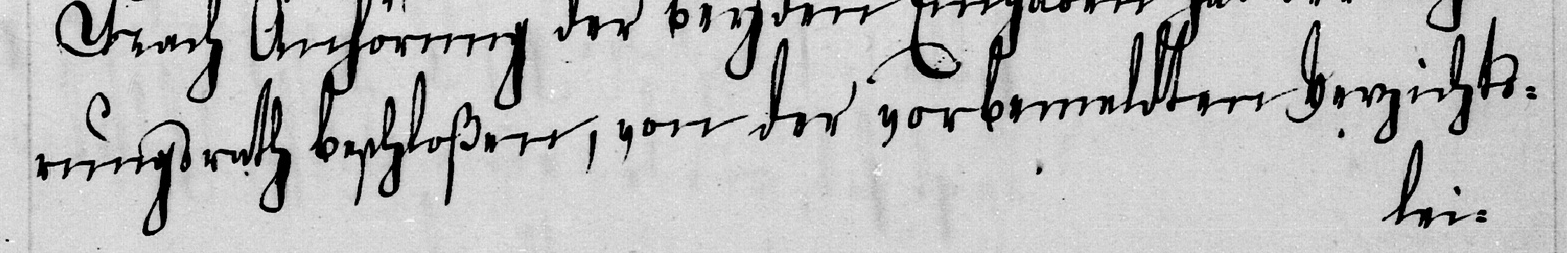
rungsrath beschloßen, von der vorbemeldten Verzichts-
